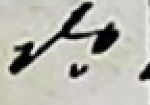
Do
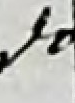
Do
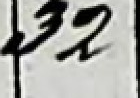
32
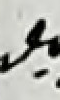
Do
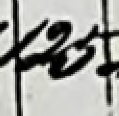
125
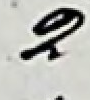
2
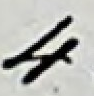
4
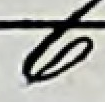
6
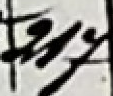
217
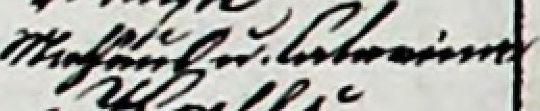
Kalss
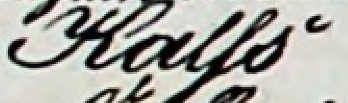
v. Geillpaul
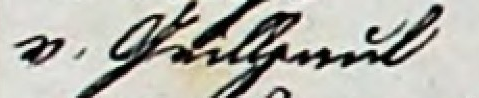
Anton u. Aloisia
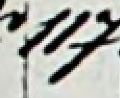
117
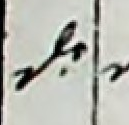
Do
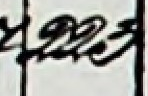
223
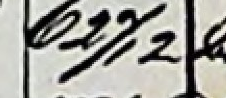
627,2
